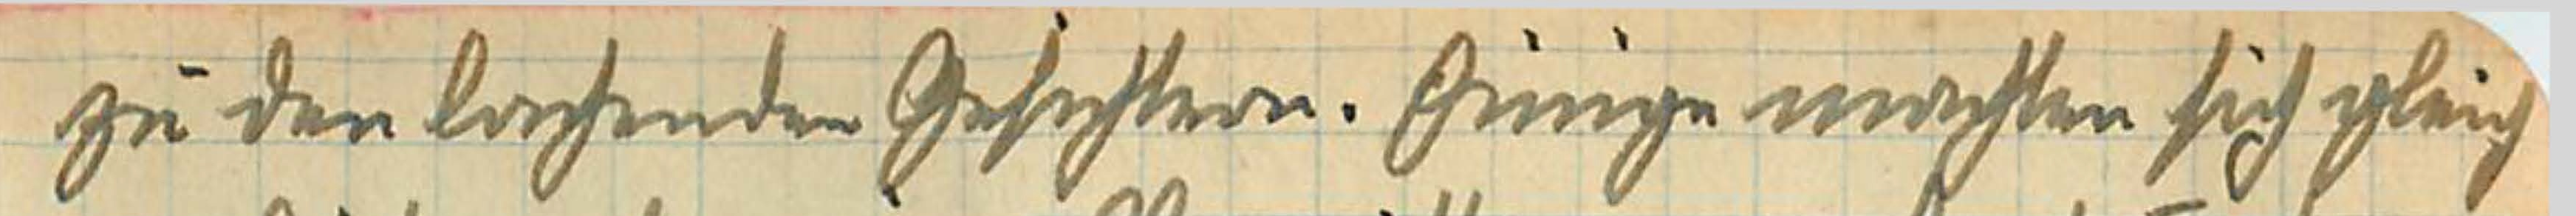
zu den lachenden Gesichtern. Einige machten sich gleich
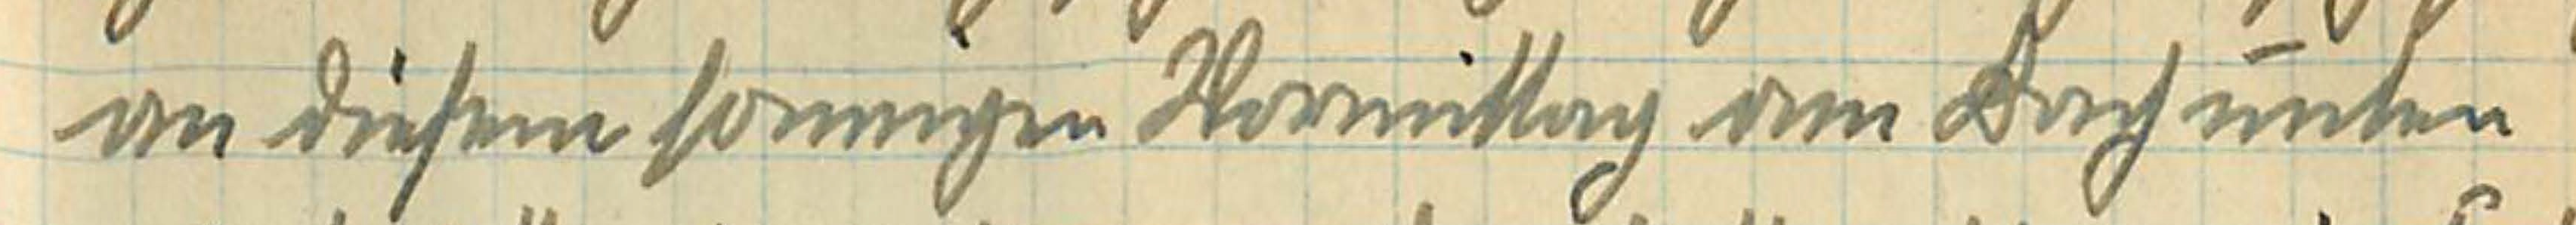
an diesem sonnigen Vormittag am Bach unten
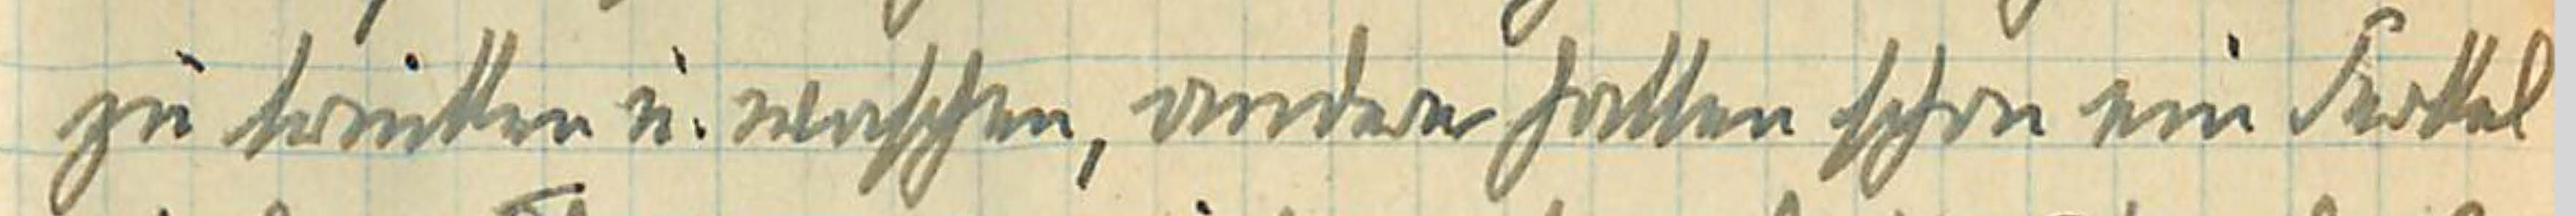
zu trinken u. waschen, andere hatten schon ein Ferkel
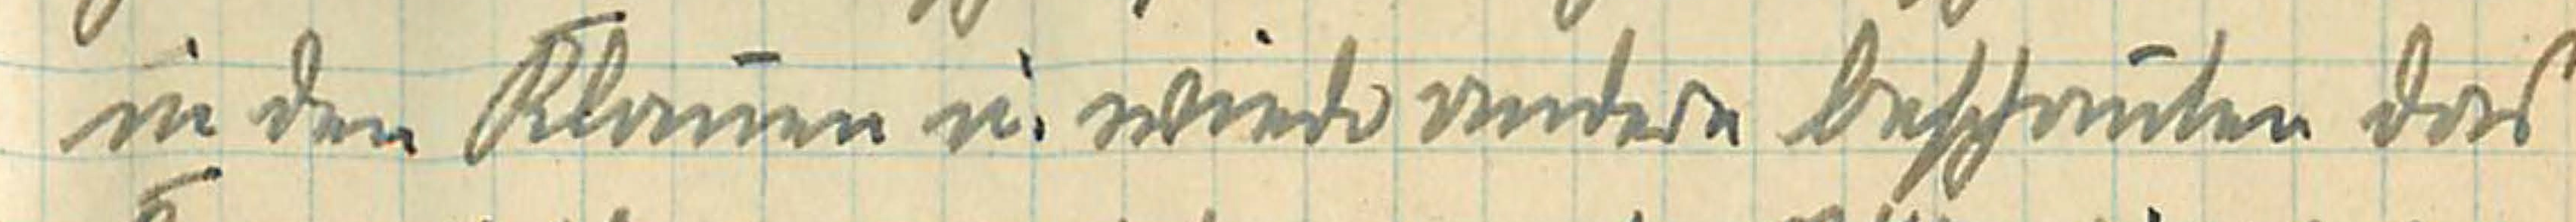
in den Klauen u. wieder andere beschauten das
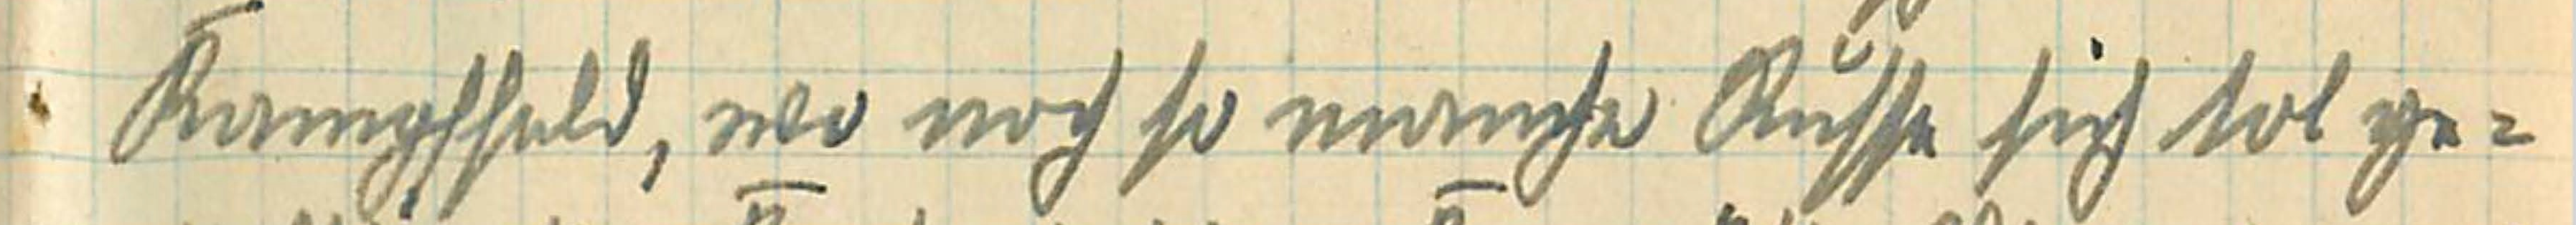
Kampffeld, wo noch so mancher Russe sich tot ge-
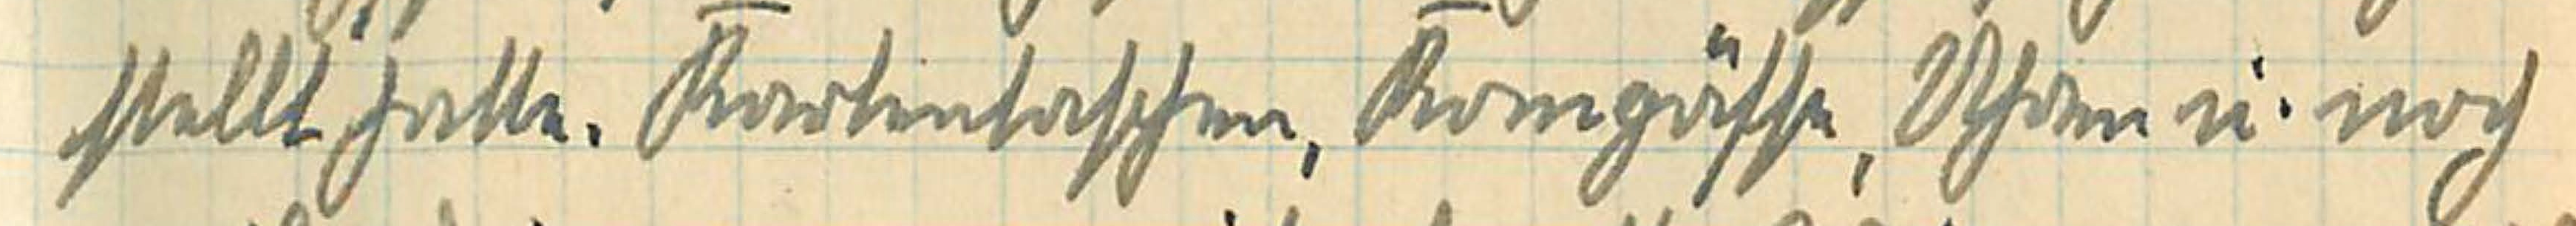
stellt hatte. Kartentaschen, Kompässe, Uhren u. noch
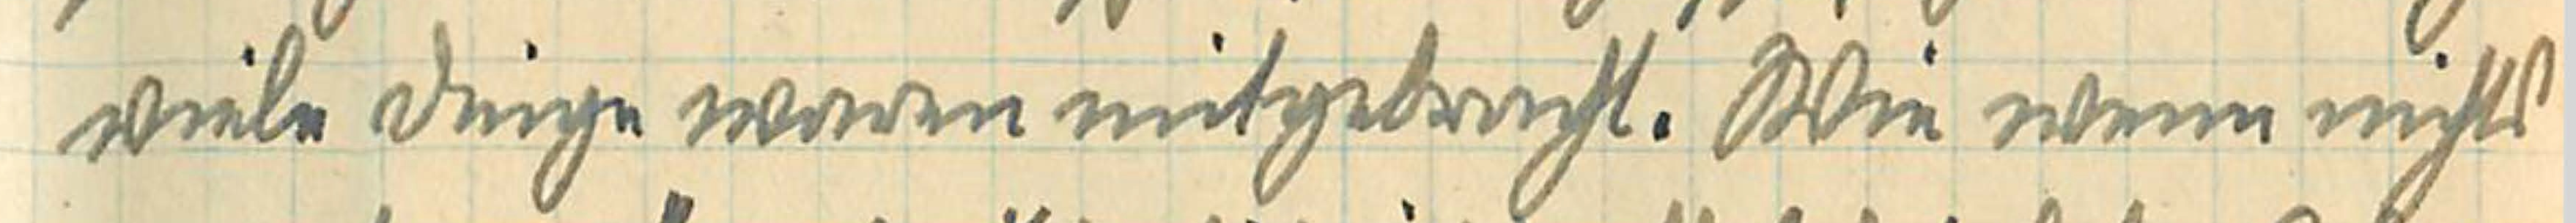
viele Dinge waren mitgebracht. Wie wenn nichts
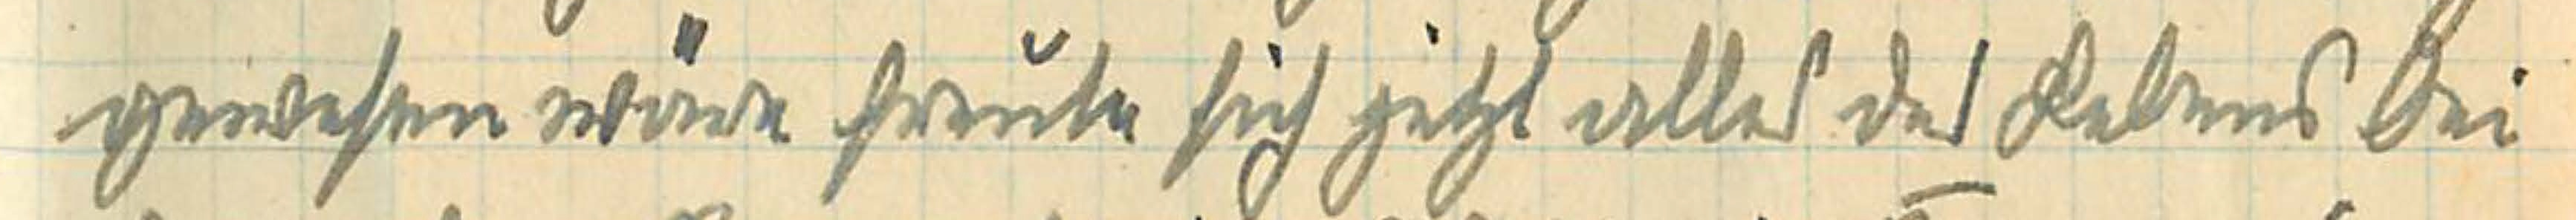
gewesen wäre freute sich jetzt alles des Lebens bei
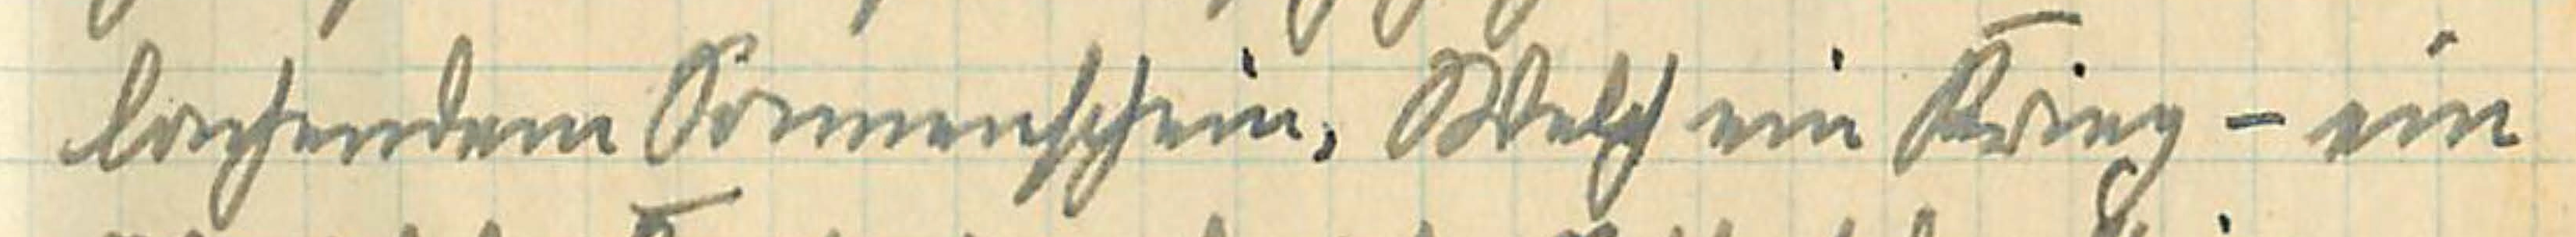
lachendem Sonnenschein. Welch ein Krieg – ein
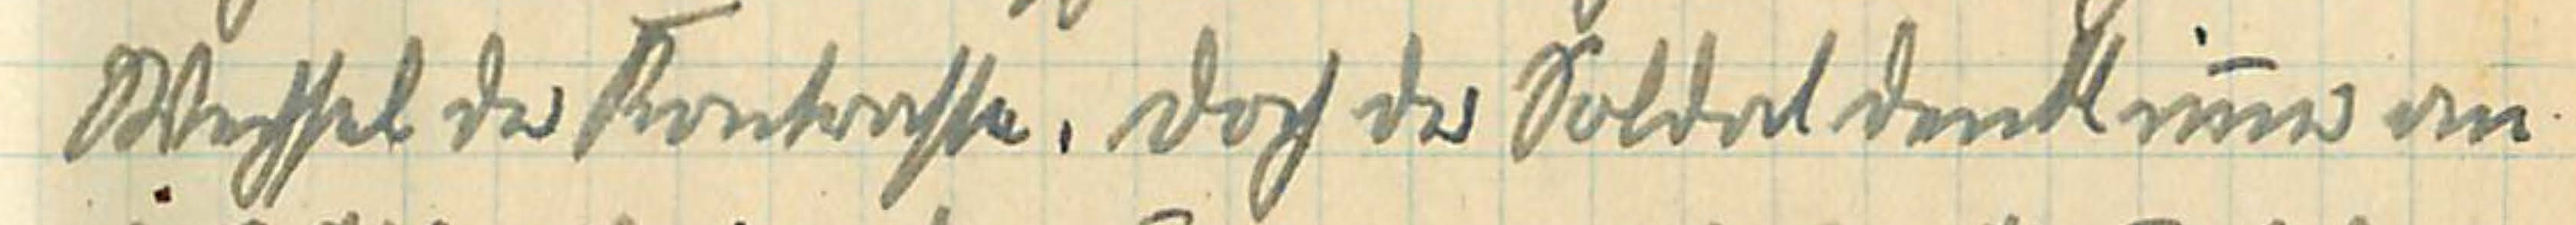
Wechsel der Kontraste. Doch der Soldat denkt immer an
